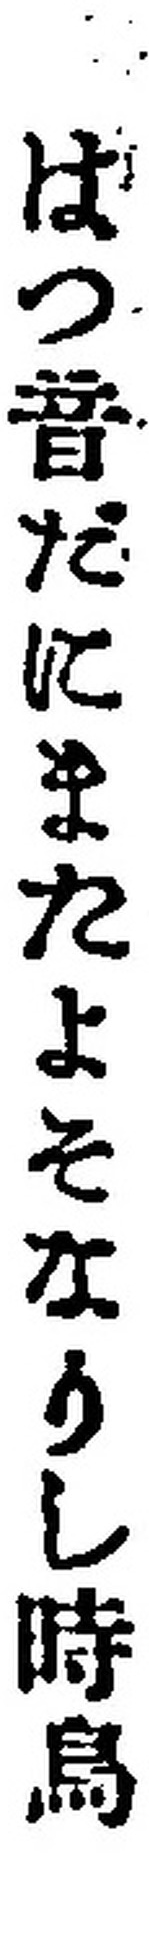はつ音だにまたよそなりし時鳥
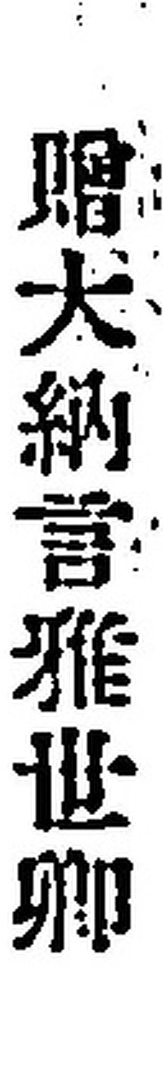贈大納言雅世卿
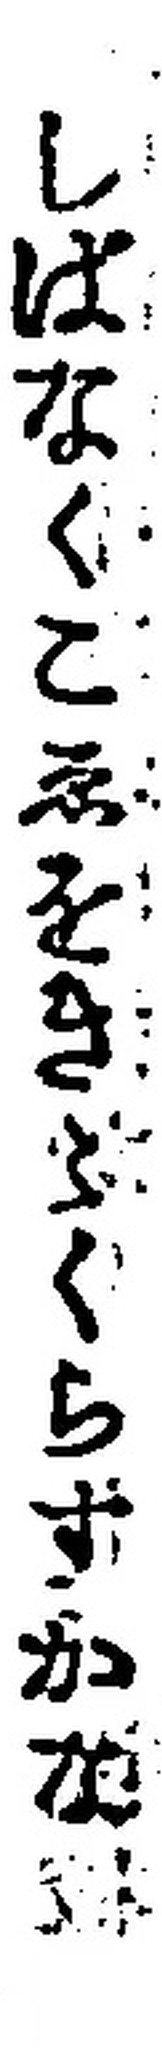しばなくこゑをきゝくらすかな
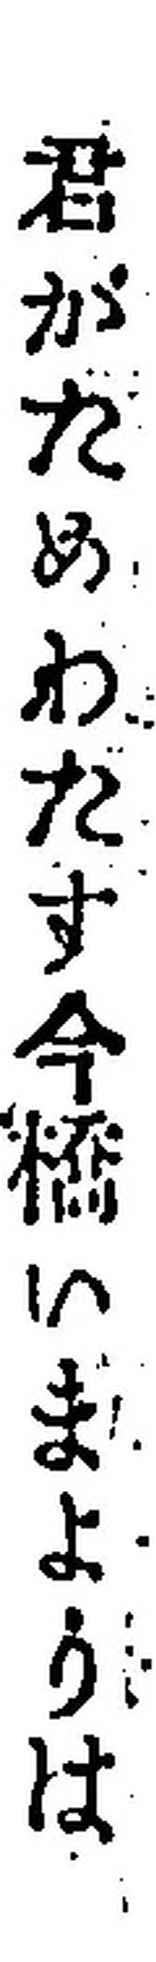君がためわたす今橋いまよりは
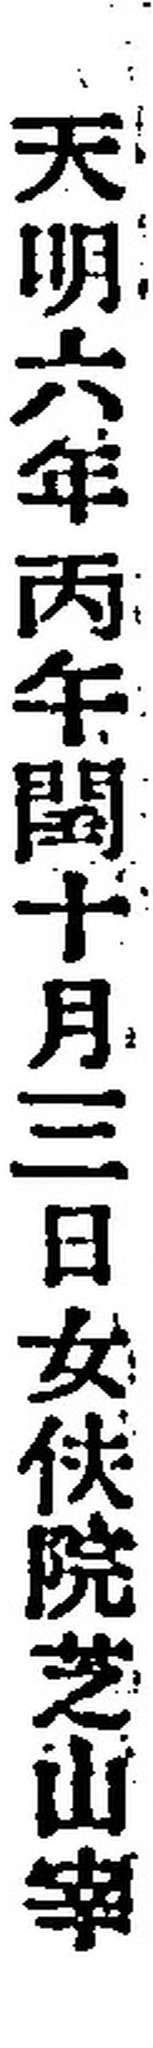天明六年丙午閏十月三日女伕院芝山宰
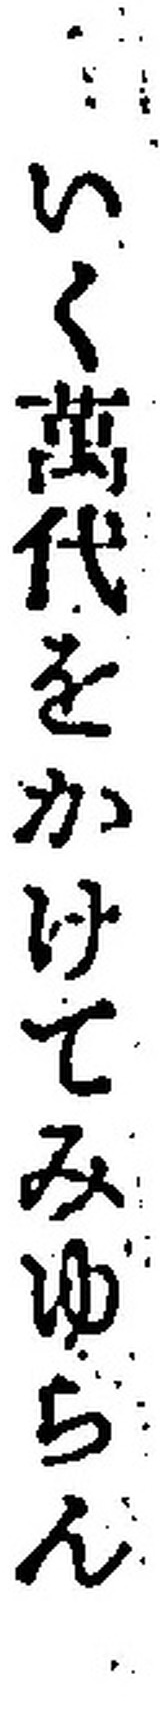いく万代をかけてみゆらん
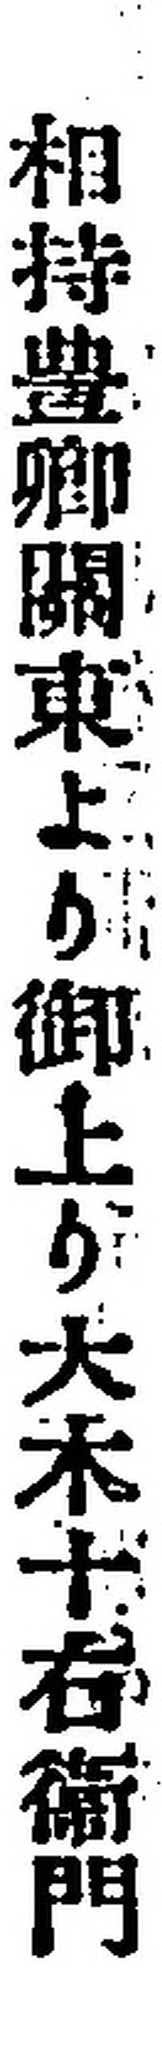相持豊卿関東より御上り大木十右衛門
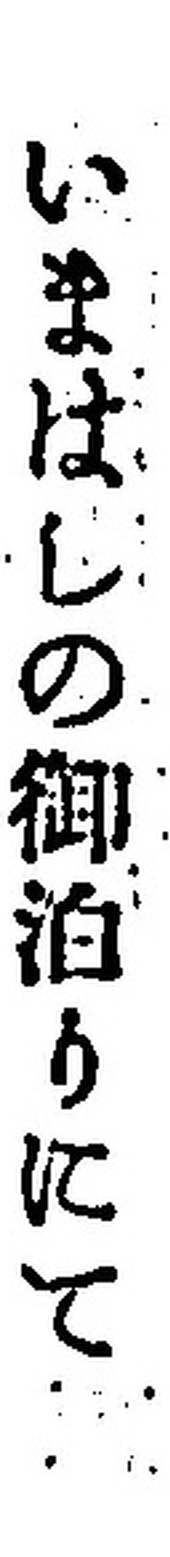いまはしの御泊りにて
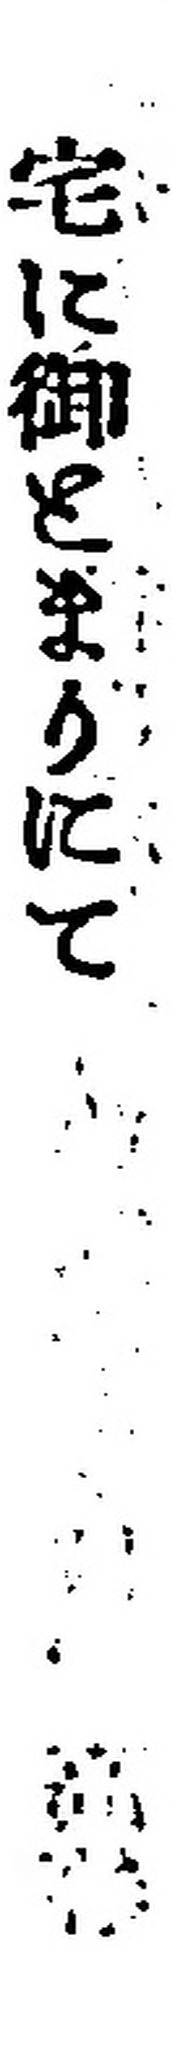宅に御とまりにて
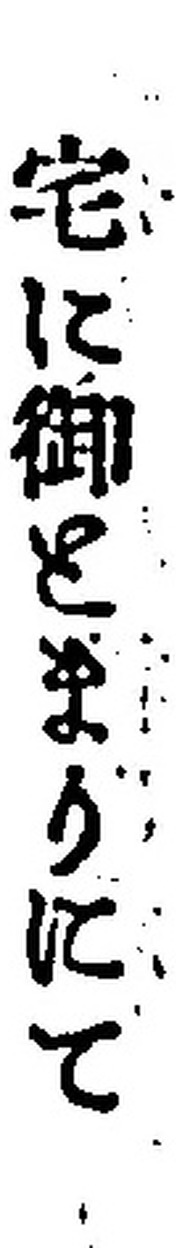宅に御とまりにて
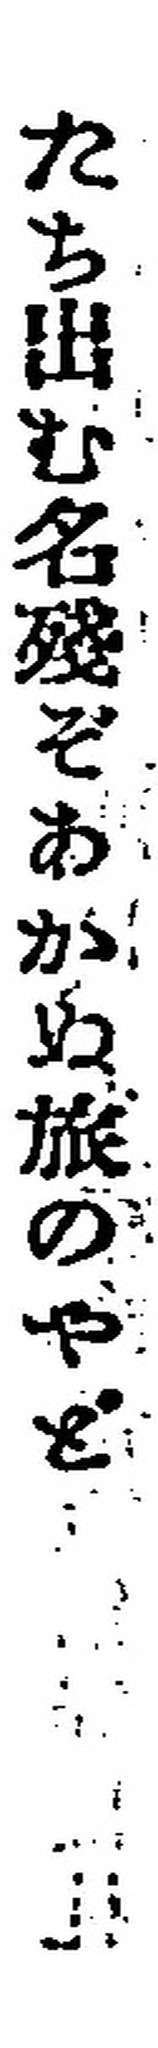たち出む名残ぞあかぬ旅のやど
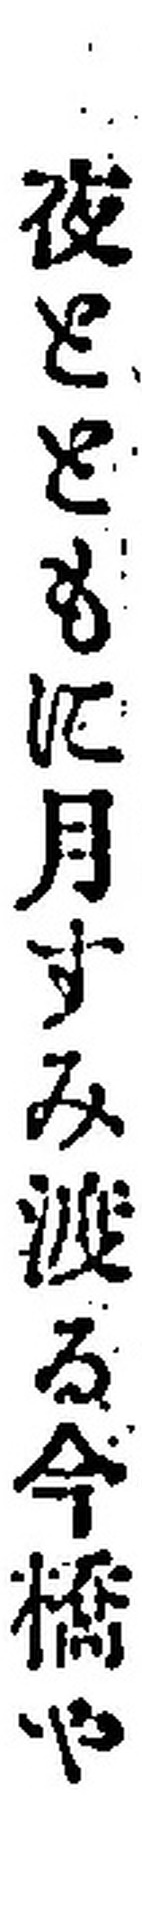夜とともに月すみ渡る今橋や
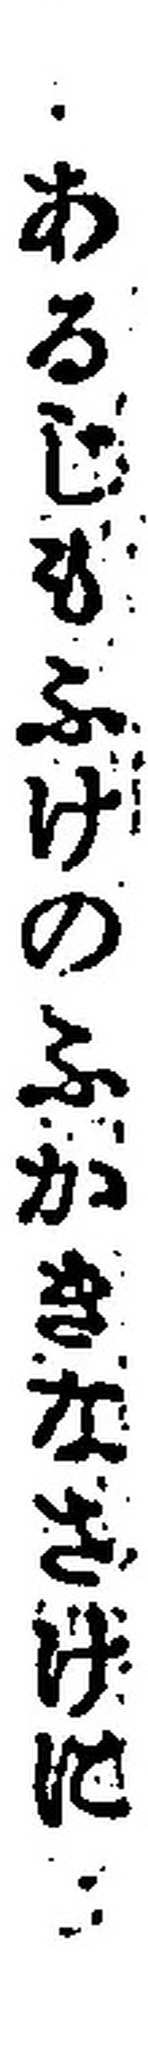あるじもふけのふかきなさけに
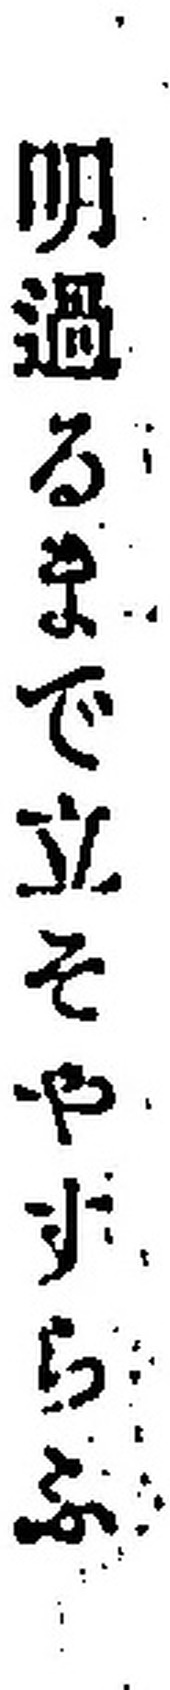明過るまで立そやすらふ
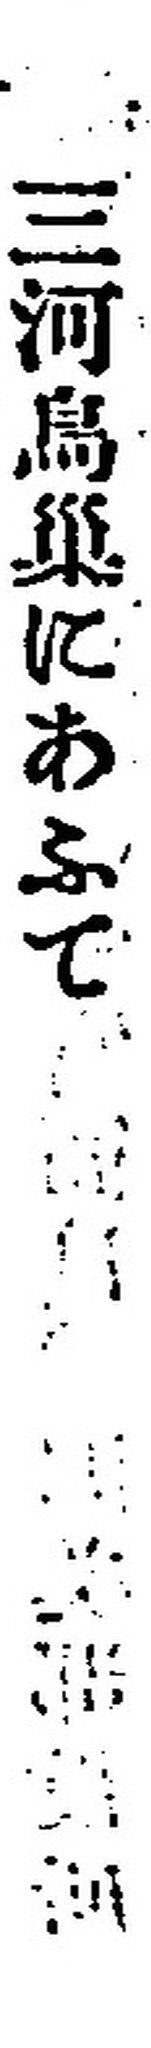三河鳥巣にあふて
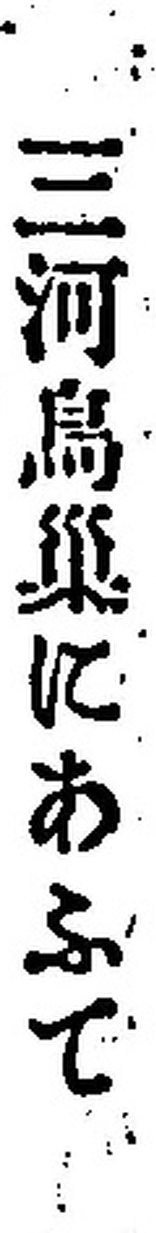三河鳥巣にあふて
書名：東参名勝案内
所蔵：国立国会図書館 National Diet Library, JAPAN
